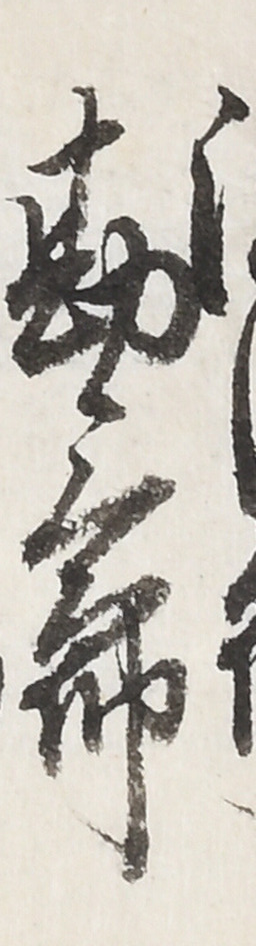勘三郎
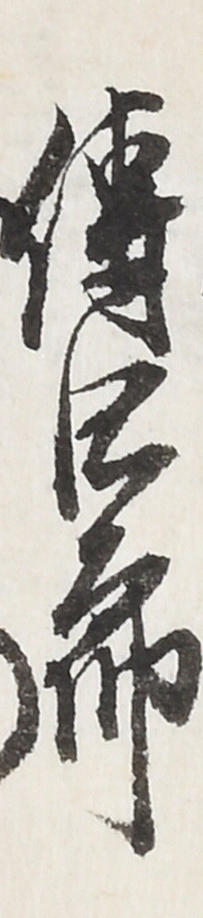伝四郎
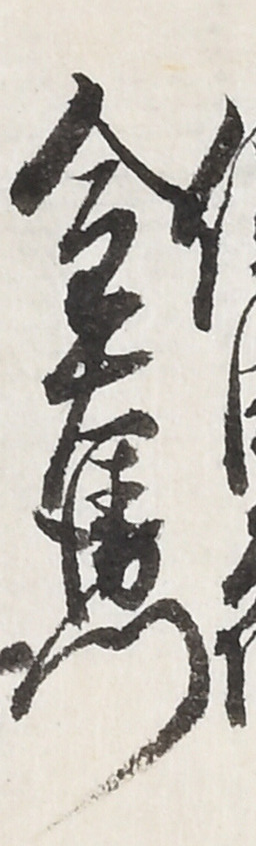金右衛門
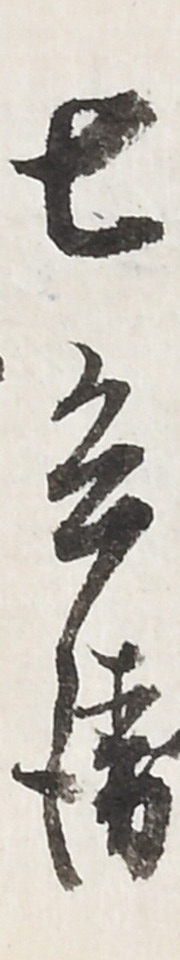七兵衛
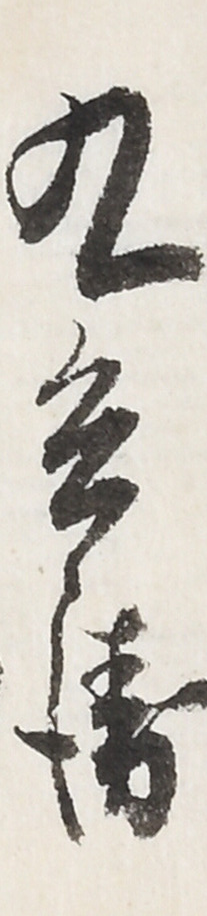九兵衛
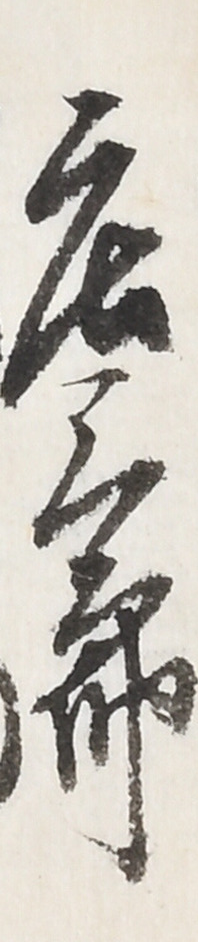庄三郎
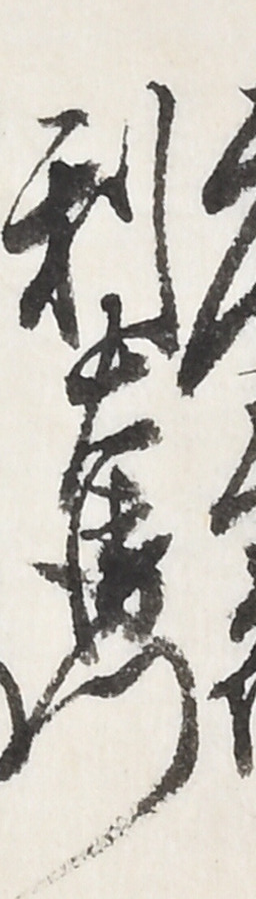利右衛門
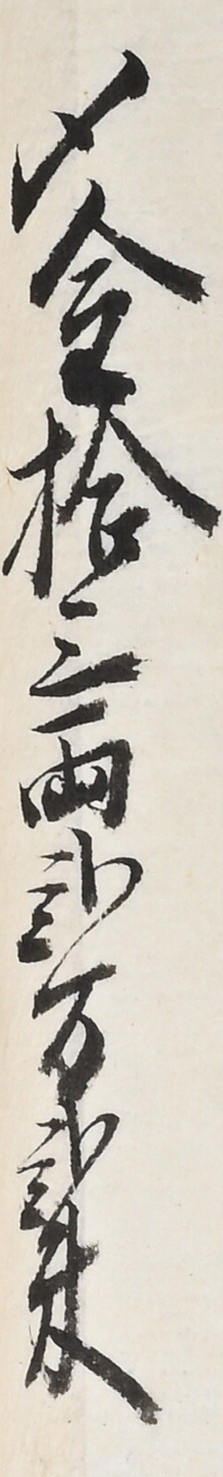〆金拾三両弐分弐朱
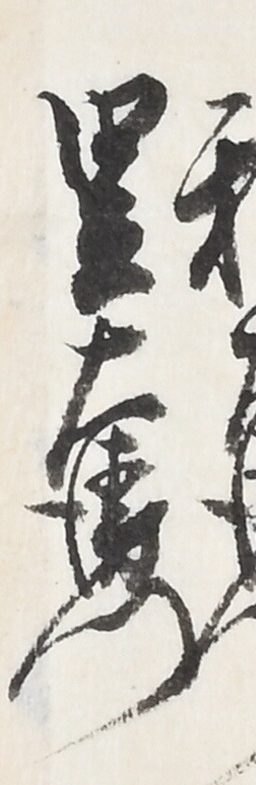里右衛門
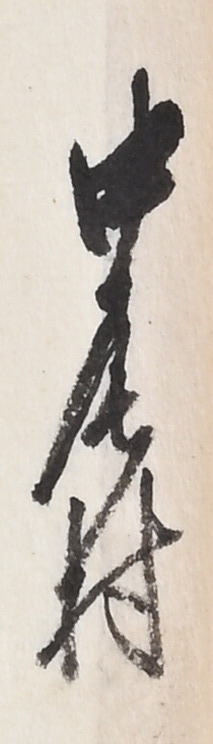中尾村
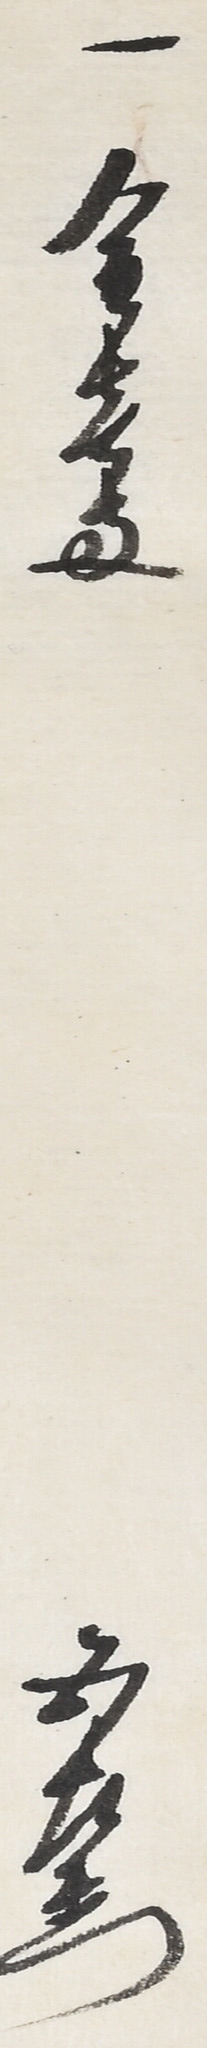一金壱両五左衛門
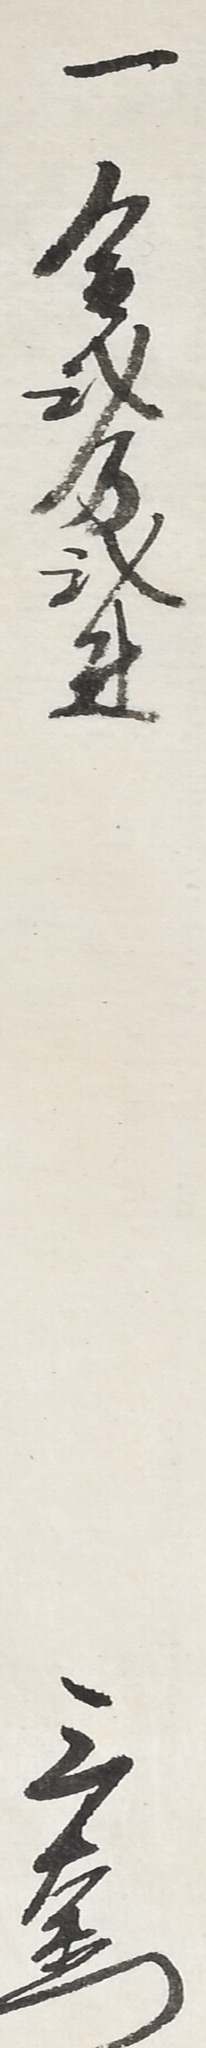一金弐分弐朱三右衛門
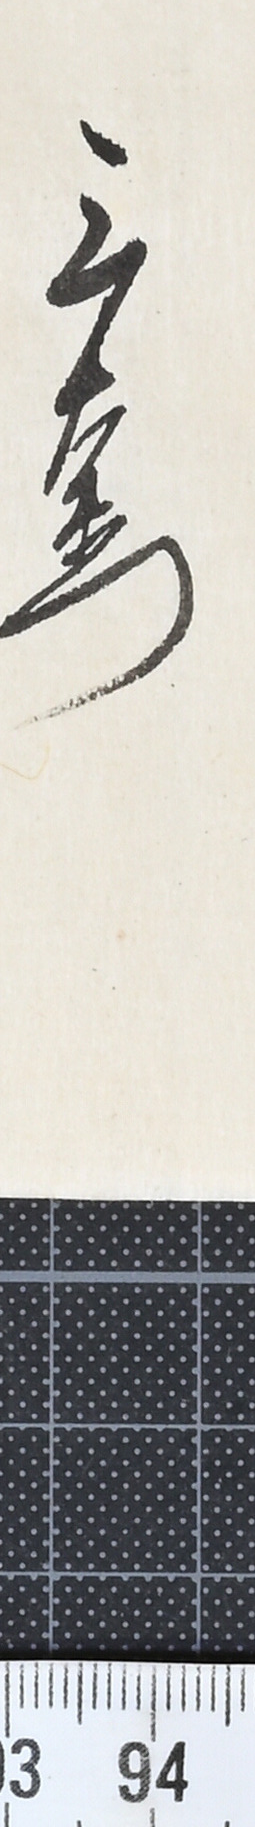金右衛門
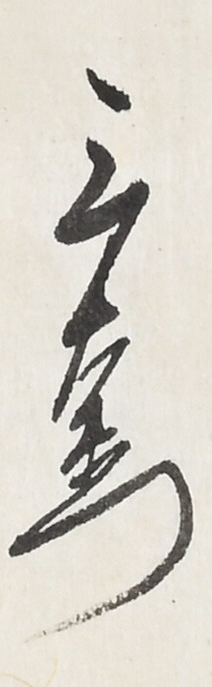金右衛門
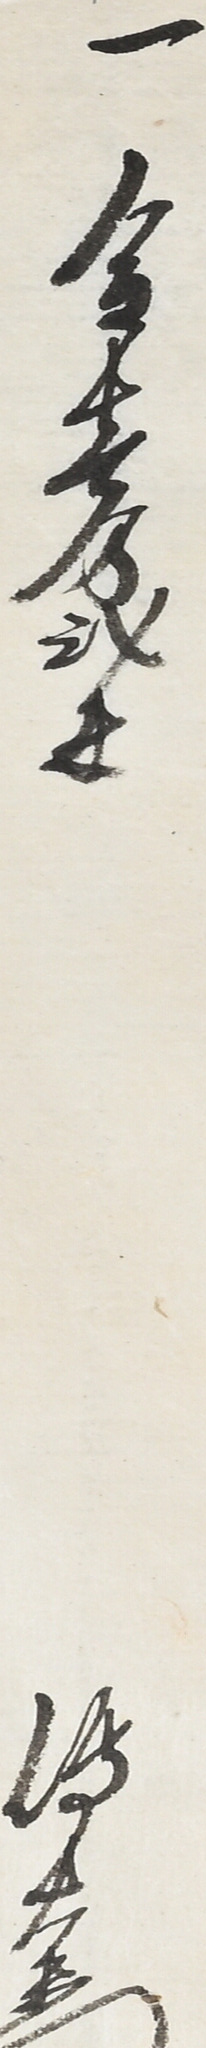一金壱分弐朱伝右衛門
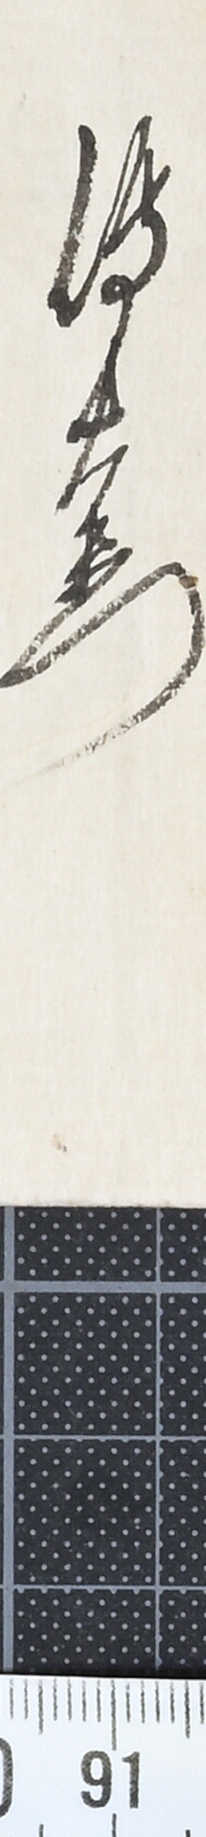金右衛門
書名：御拝地百五拾年御祝儀献上御目録名前
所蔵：伊那市立高遠町図書館・合同会社AMANE
